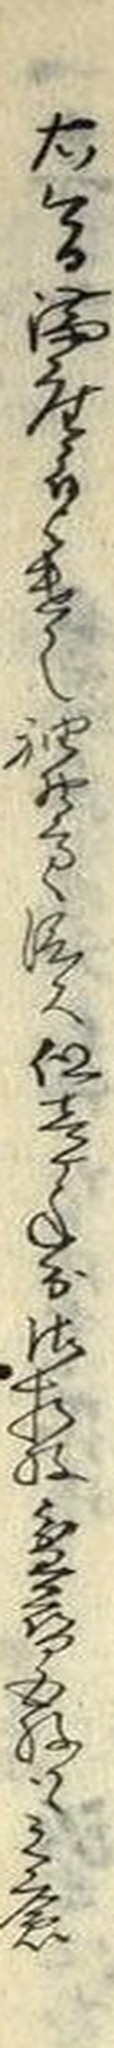右今日満座ニ付被遣之袖野方へ渡ス但壱ケ年分銀拾枚盆暮五枚ツヽ之廉
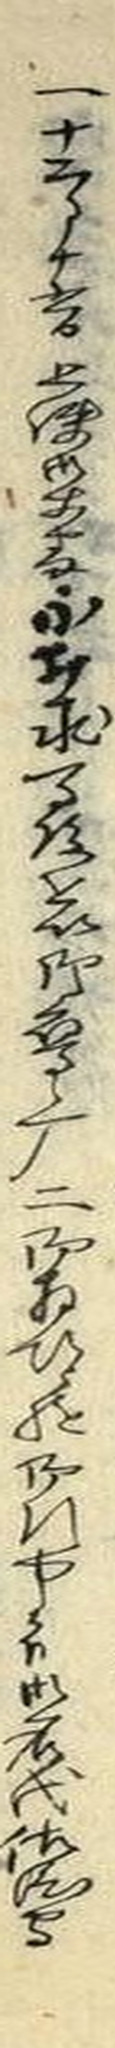一十二月十六日上使御使番永井求馬殿を以御鷹之雁二御拝領被遊御引中ニ付御名代佐渡守
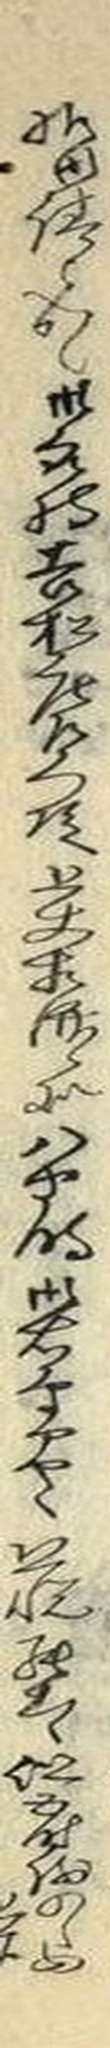様御請被成候御取持吉松庄左衛門殿上使相済候処八半時御右筆部屋へ恐悦罷出候但五時揃のしめ上下
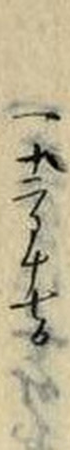一十二月十二日

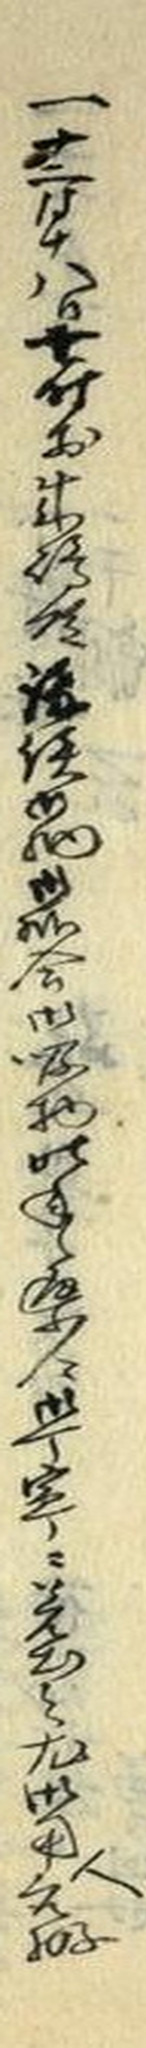一十二月十八日七時前成嶋殿講談御納御掛合御吸物昨年之通少々御丁寧ニ差出之尤御用人取扱
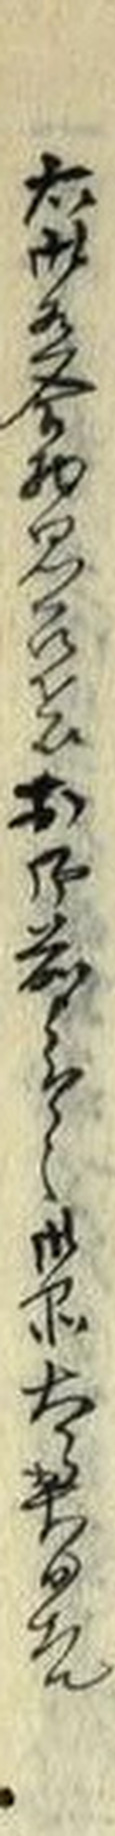右御有合物思召を以於御前被下之御品大奥ゟ出ル
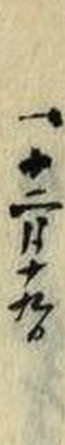一十二月十九日
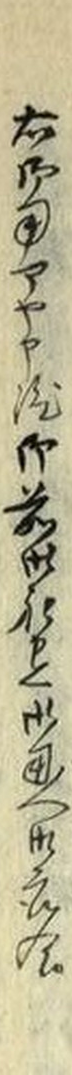右御用部屋申渡御前御礼申上御用人取合
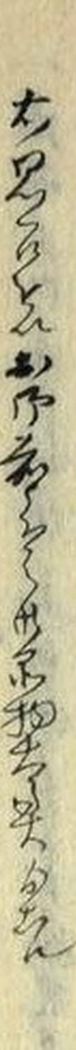右思召を以於御前被下之御品物大奥ゟ出ル
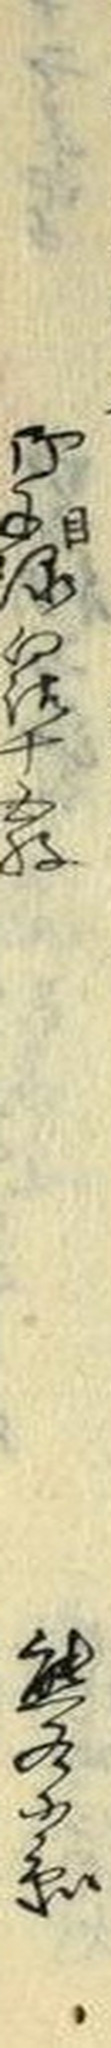御手目録白銀十五枚熊谷小兵衛
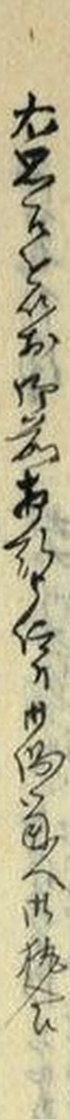右思召を以於御前拝領被仰付御側御用人御執合
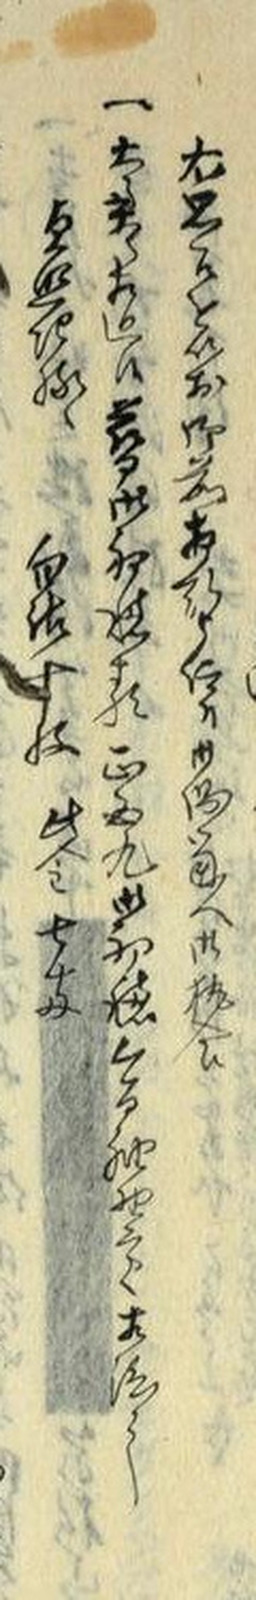一大奥へ相廻候暮御初穂類正五九御初穂今日袖野方へ相渡之
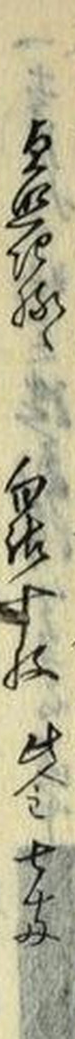貞照院様へ白銀十枚此金七両
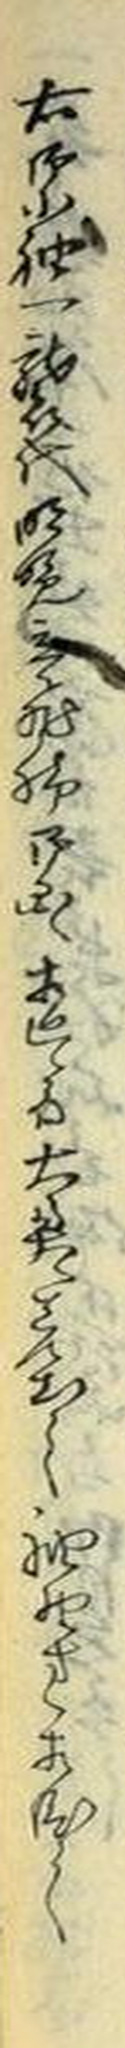右御小袖一襲代明晩立飛脚御国へ相廻候ニ付大奥へ差出之袖野方へ相渡之
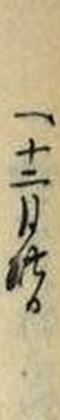一十二月十九日
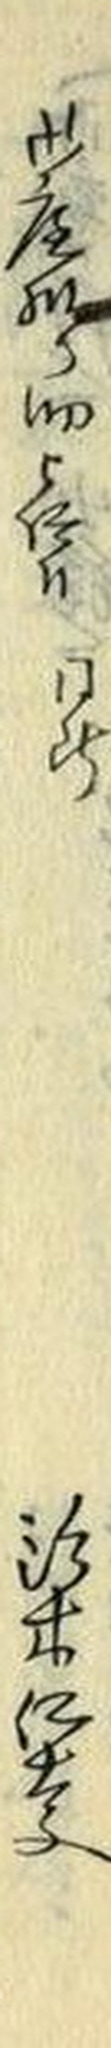御庭掛り助被仰付同断鈴木仁太夫
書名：少傅日録抄（斉善付側向頭取日記、在府）
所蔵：福井県文書館 Fukui Prefectural Archives
